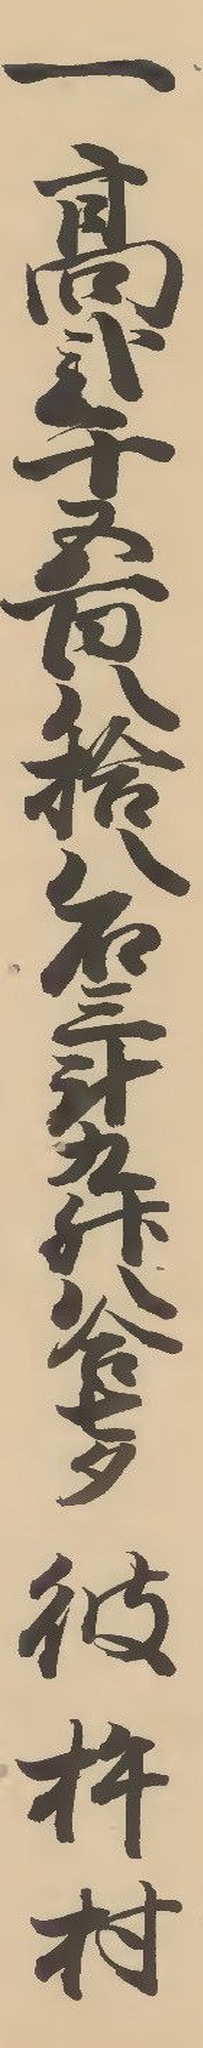一髙弐千五百八拾八石三斗九升八合七夕
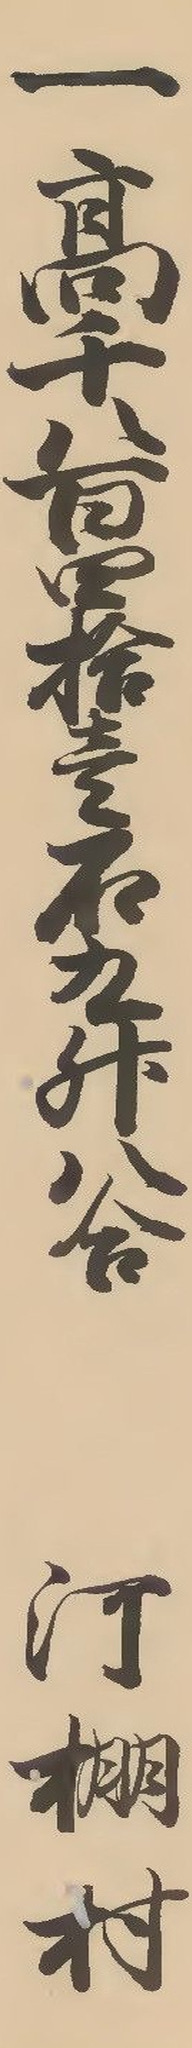一髙千八百四拾壱石九升八合河棚村
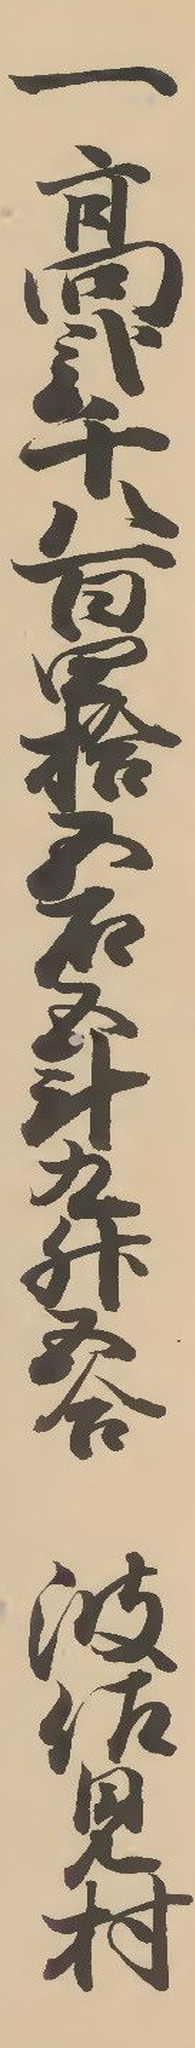一髙弐千八百四拾五石五斗九升五合波佐見村
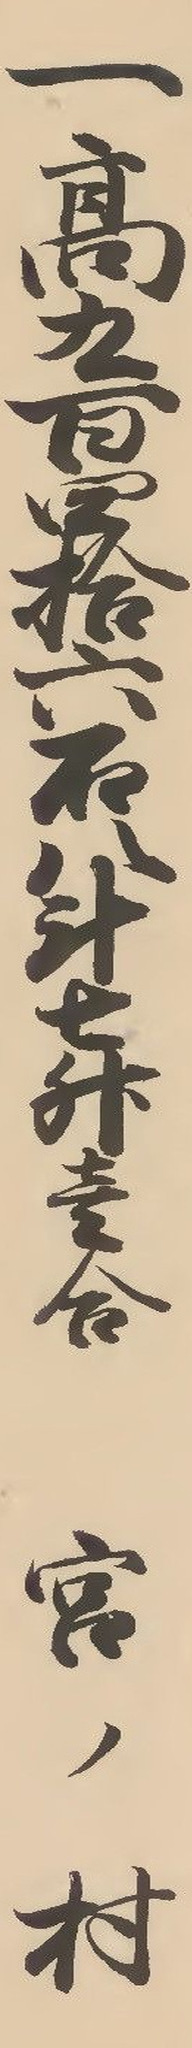一髙九百四拾六石八斗七升壱合宮ノ村
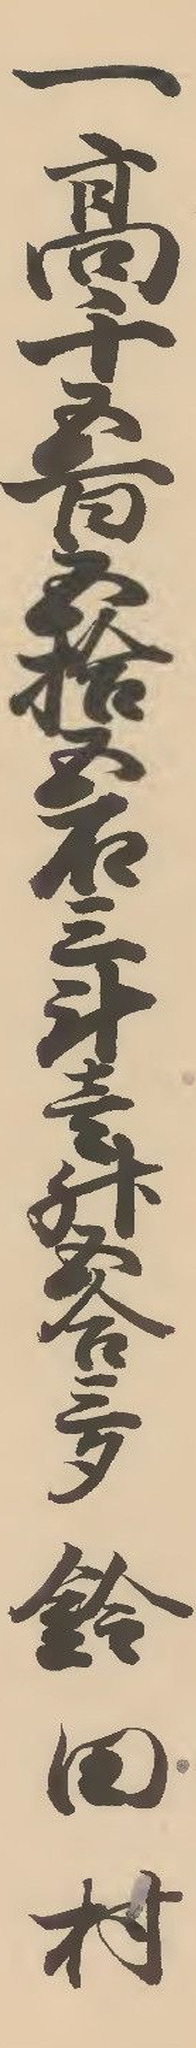一髙千五百五拾五石三斗壱升五合三夕
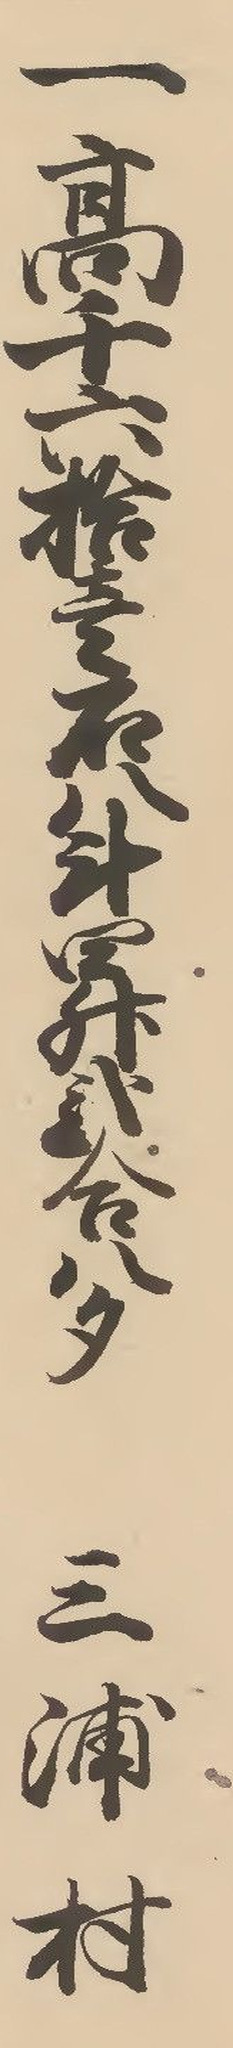一髙千六拾壱石八斗四升弐合八夕三浦村
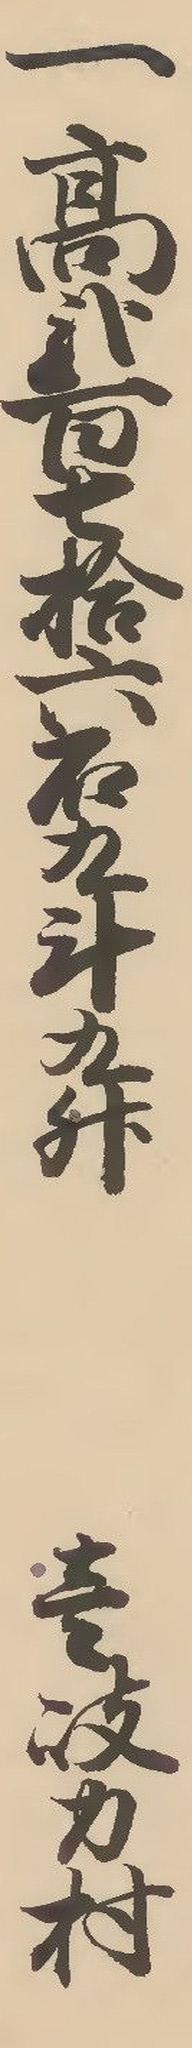一髙弐百七拾六石九斗九升壱岐力村

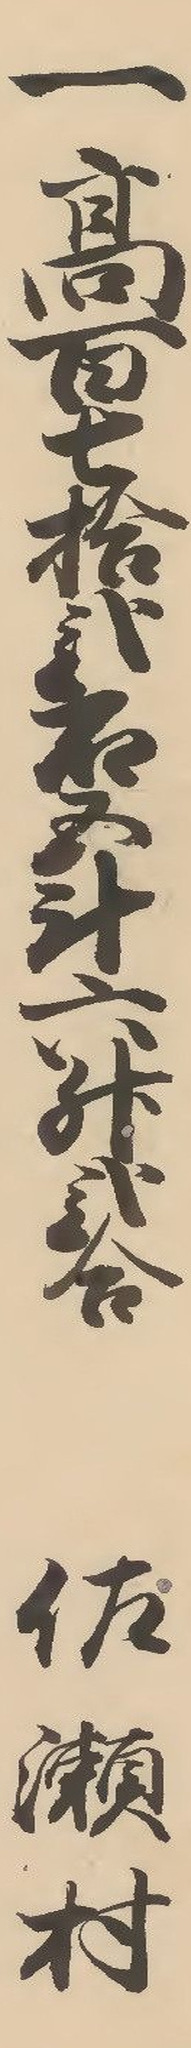一髙百七拾弐石五斗六升弐佐瀬村
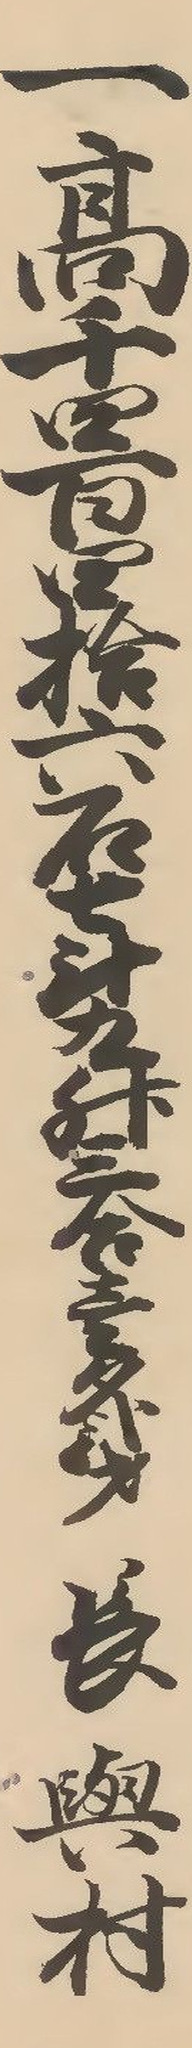一髙千四百四拾六石七斗九升三合壱夕弐才
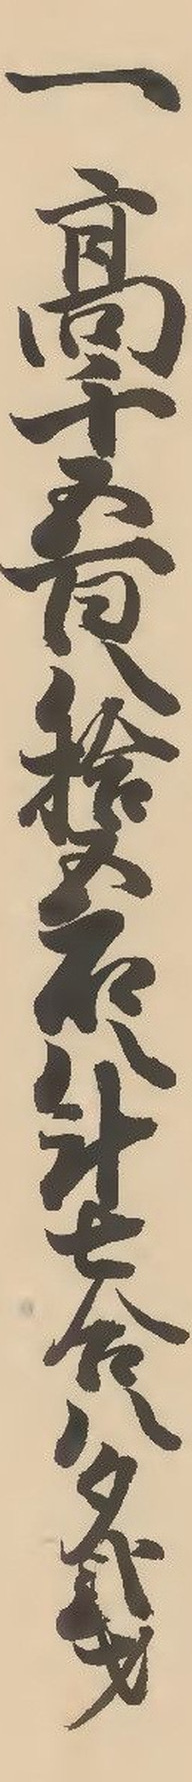一髙千五百八拾五石八斗七合八夕弐才
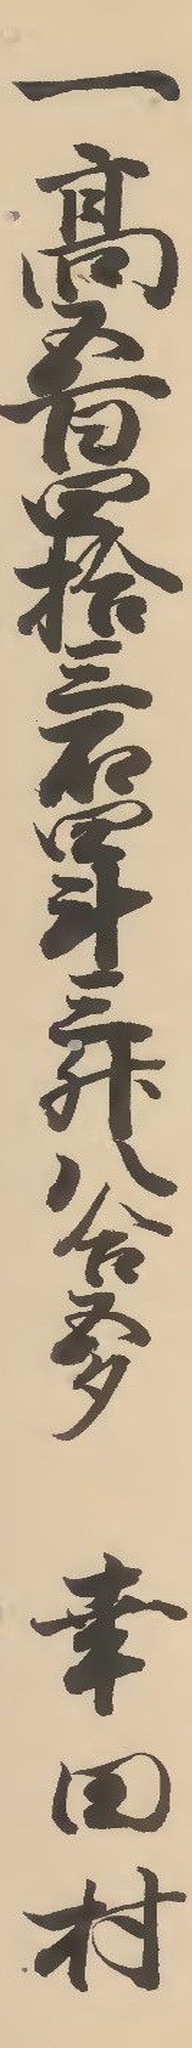一髙五百四拾三石四斗三升八合五夕
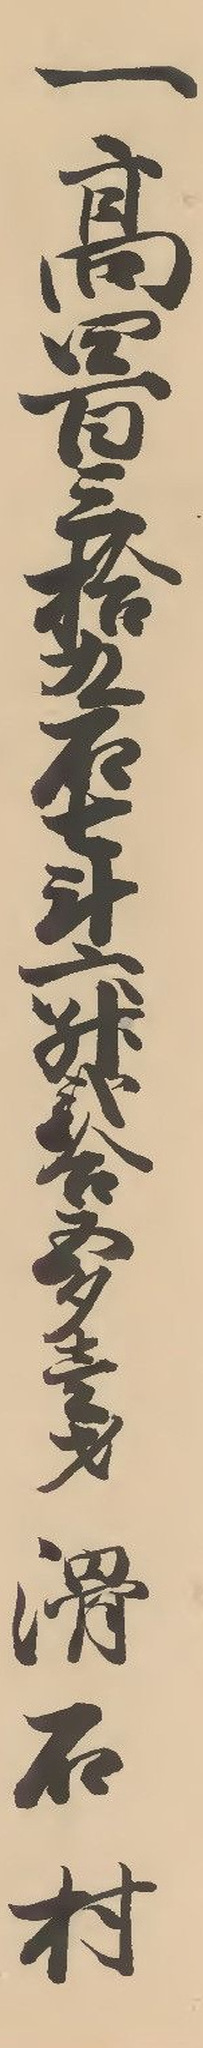一髙四百三拾九石七斗六升弐合五夕壱才
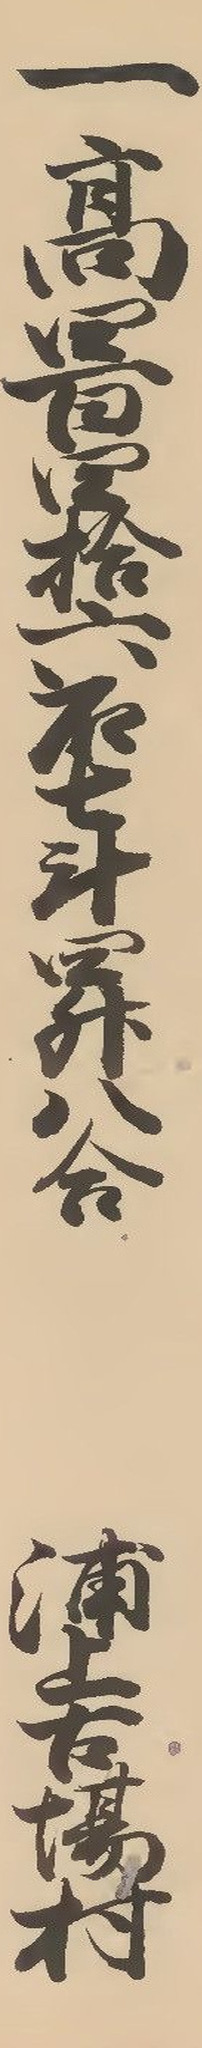一髙四百四拾六石七斗四升八合浦上古場村
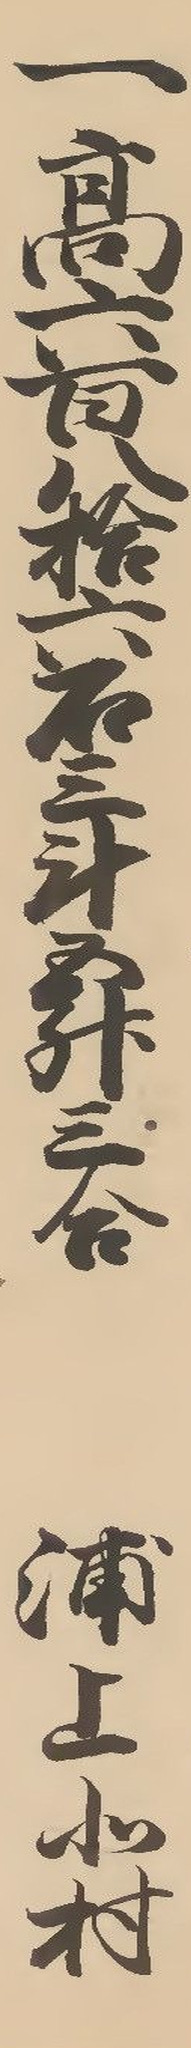一髙六百八拾六石三斗五升三合浦上北村
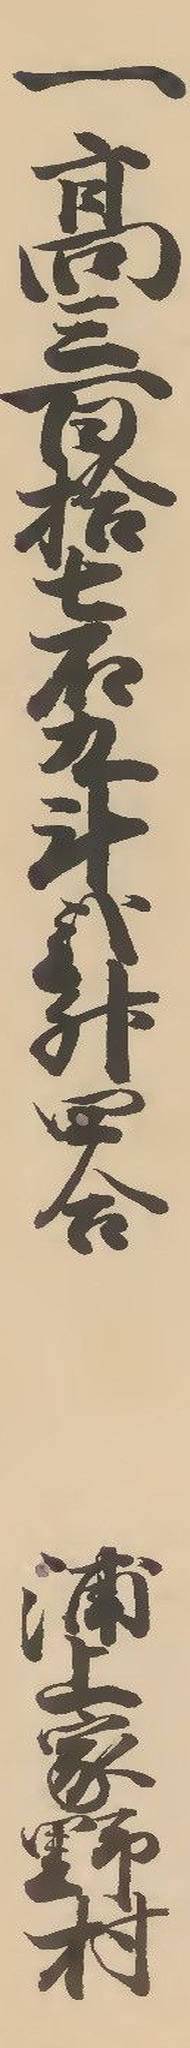一髙三百拾七石九斗弐升四合浦上家野村

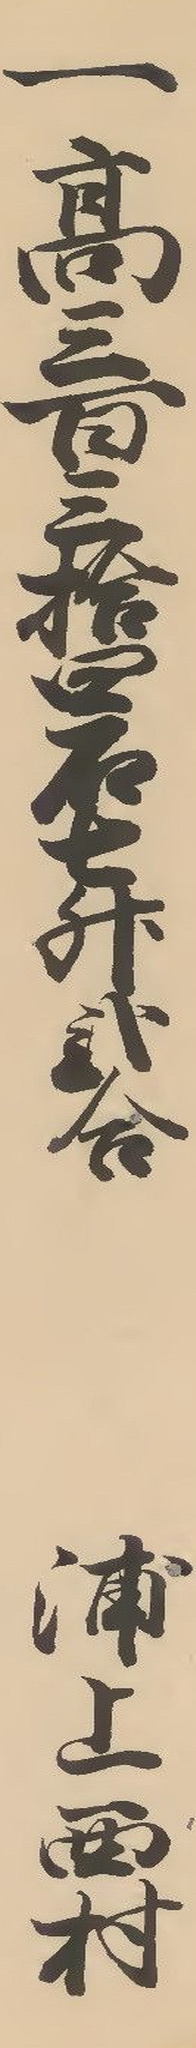一髙三百三拾四石七升弐合浦上西村
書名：肥前国郷帳
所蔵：国立公文書館 National Archives of Japan
